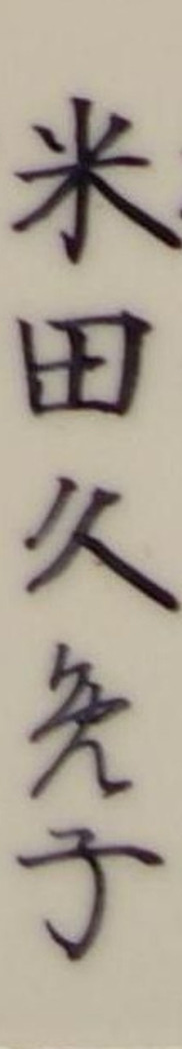米田くめ子
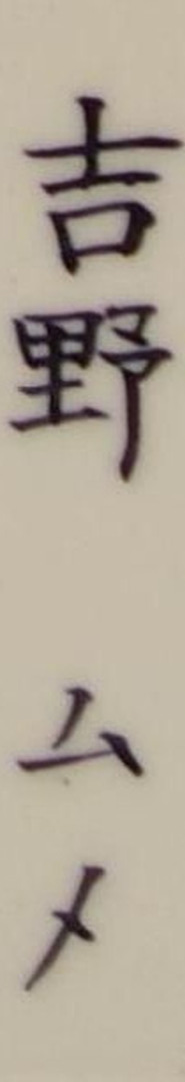吉野ムメ
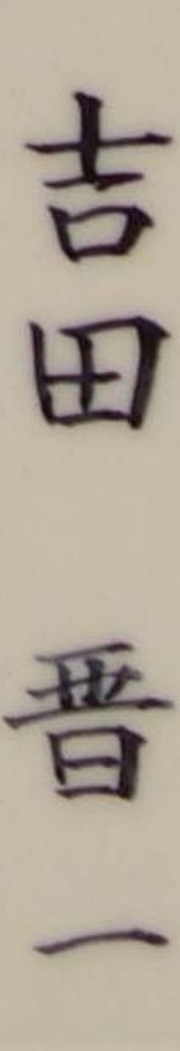吉田晋一
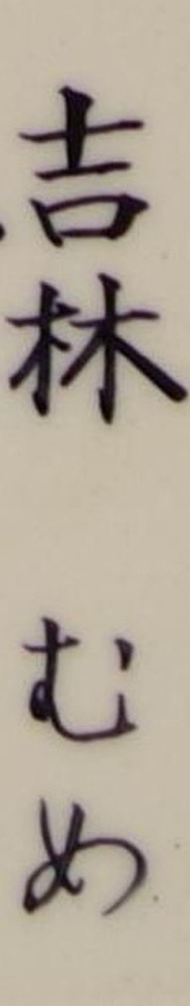吉林むめ
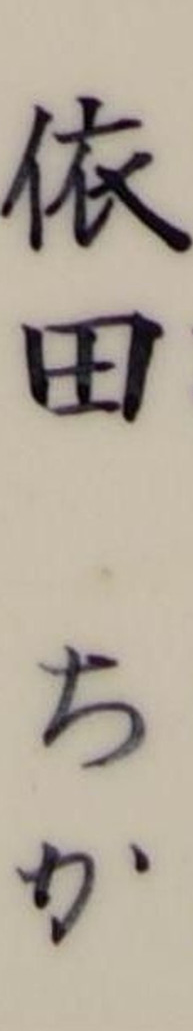依田ちか
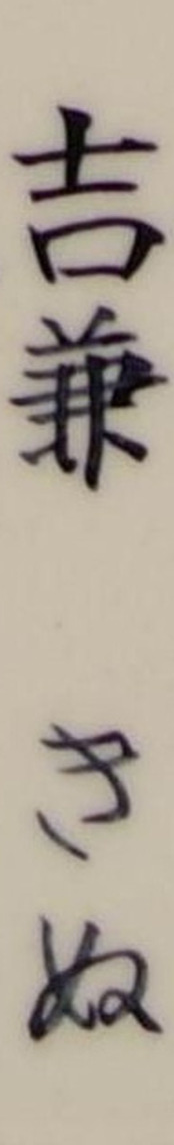吉兼きぬ
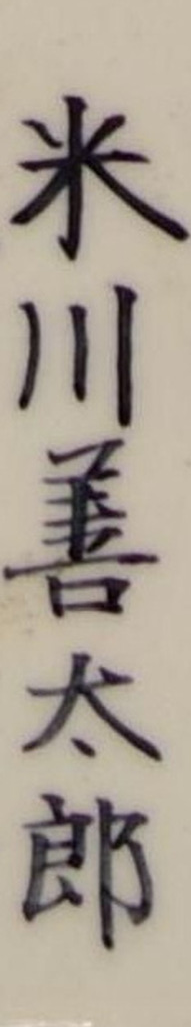米川善太郎
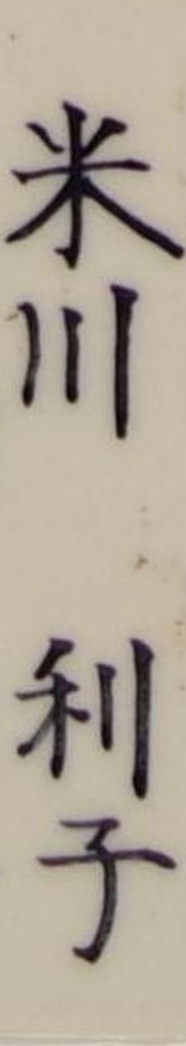米川利子
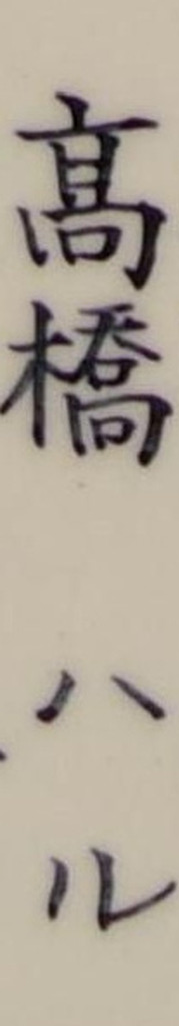高橋ハル
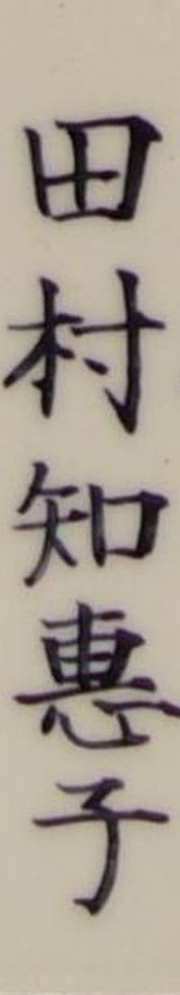田村知恵子
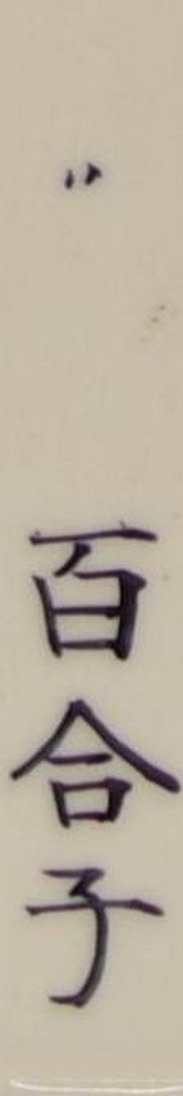百合子
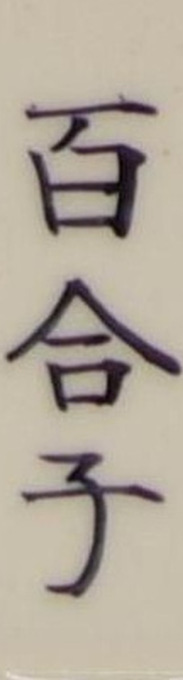百合子
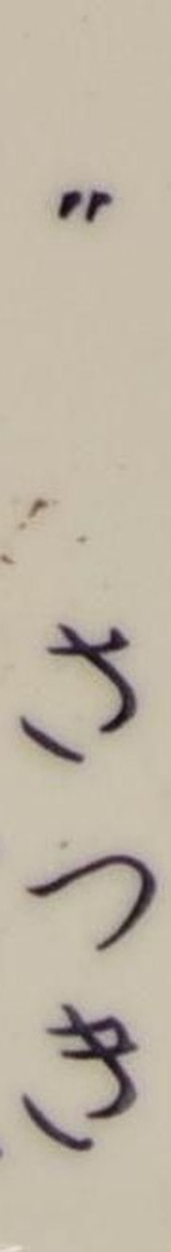さつき
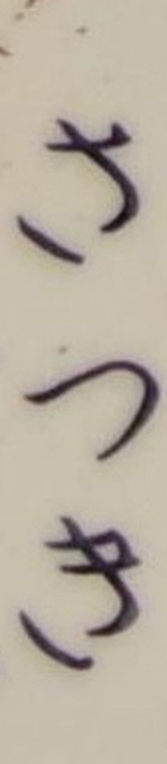さつき
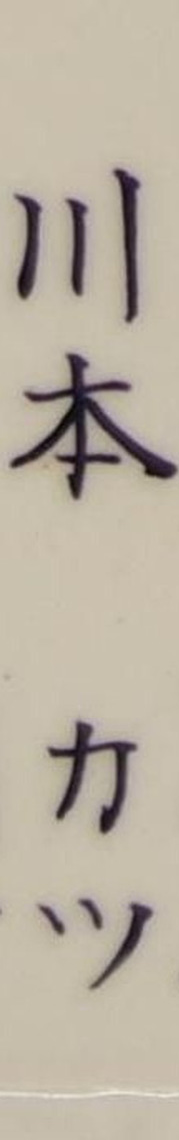川本カツ

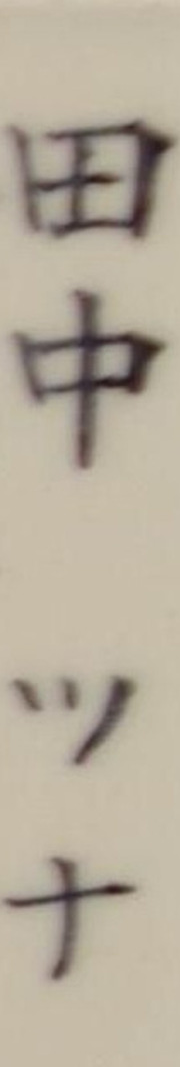田中ツナ
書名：M~S
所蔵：高野山金剛峯寺
